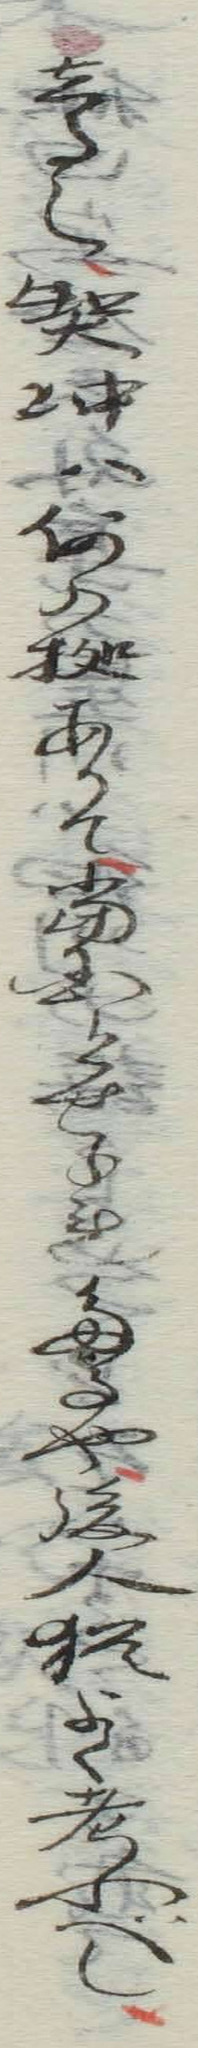しるし、契冲は何の拠ありて、当国とせられたるや後人猶よく考ふべし、
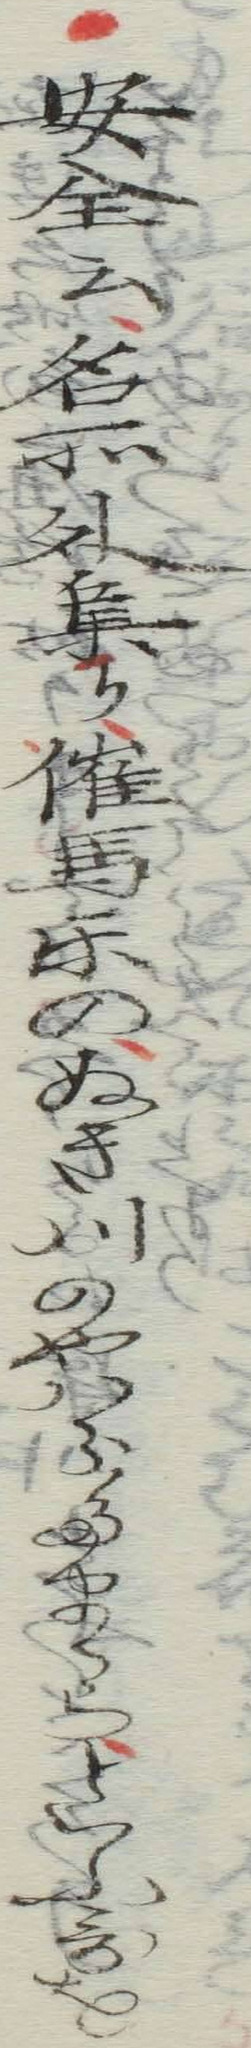●安全云、名所外集に、催馬楽の、ぬき川のやはらたまくら、といふ歌を
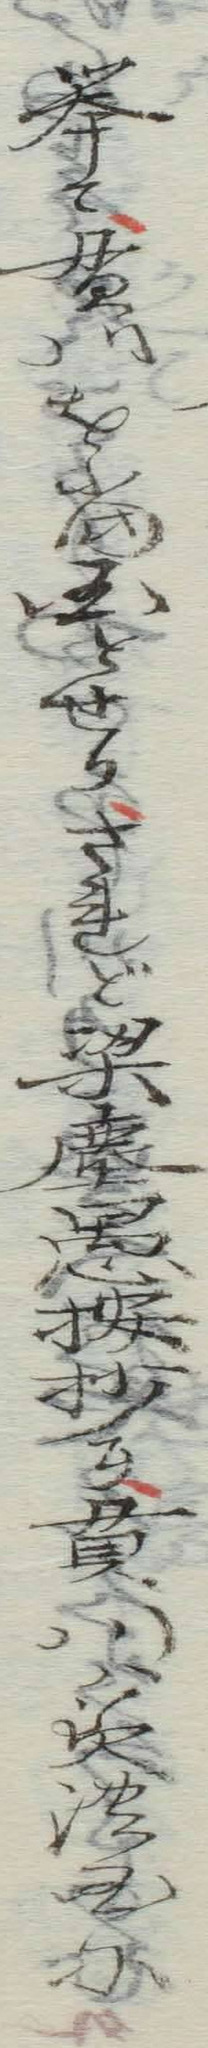挙て、貫川を当国とせり、されど梁塵愚按抄に、貫川は美濃国に
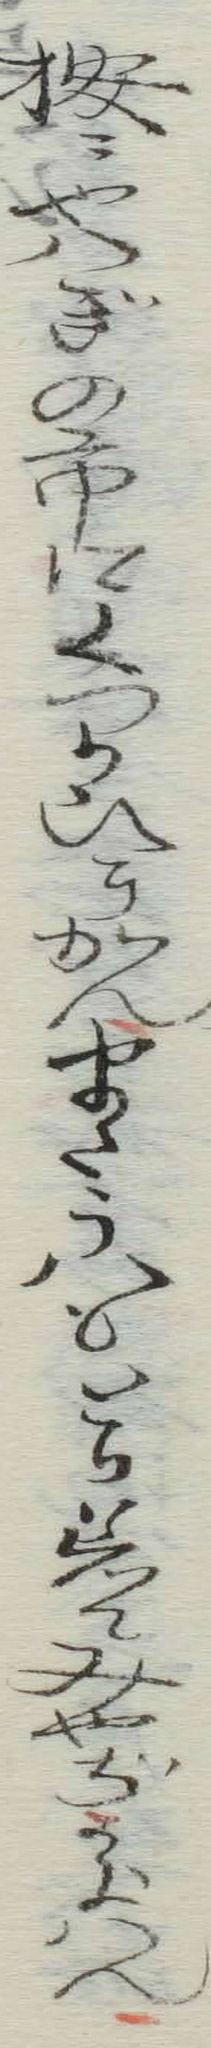按ニやはぎの市にくつかひにかん、またうはもとり着てみやぢかよはん、
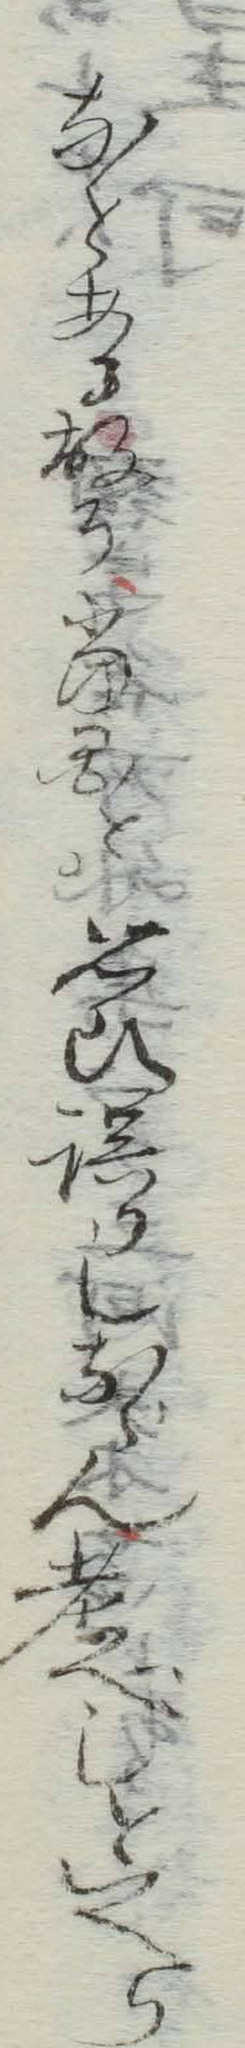なとある故に、当国とは思ひ誤りしならん、考べしといへり、
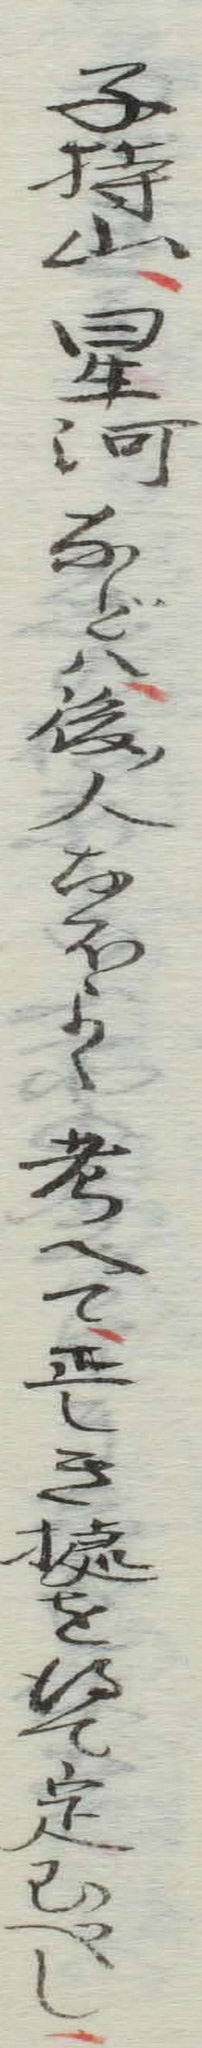子持山、星河などは、後人なほよく考へて、正しき拠を得て定むべし、
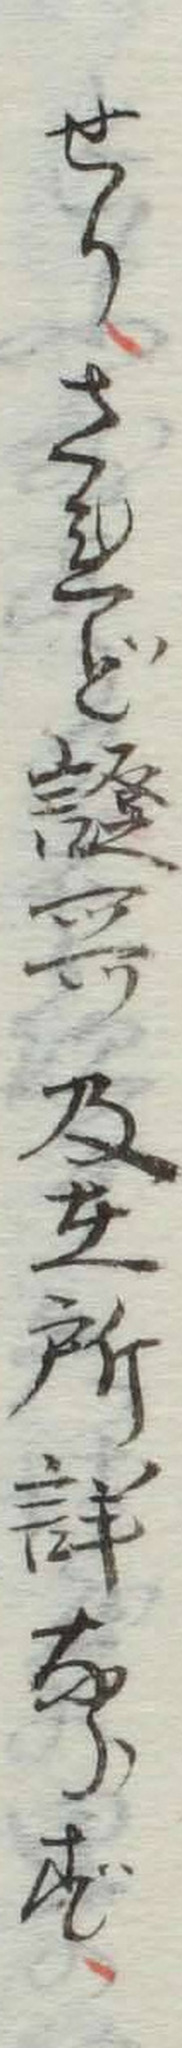せり、されど証歌及在所詳ならず、
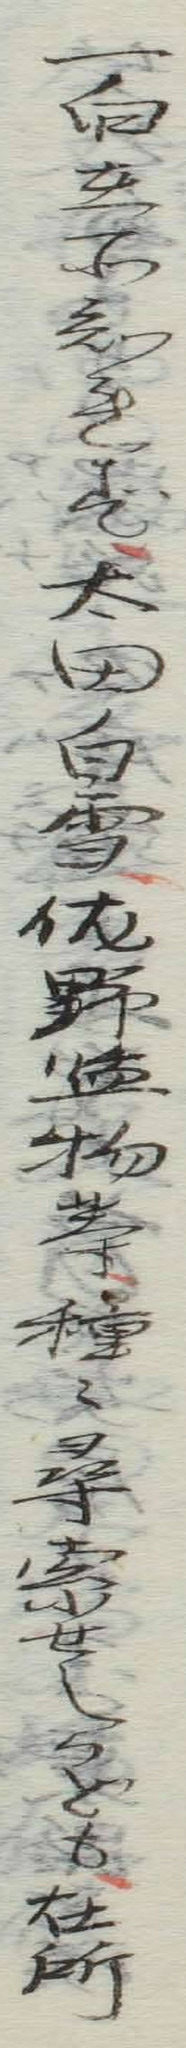一向在所知れず、太田白雪、佐野監物等、種々尋索せしかども、在所
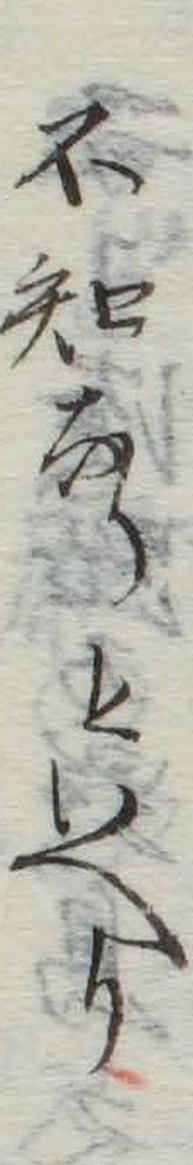不知なりといへり、
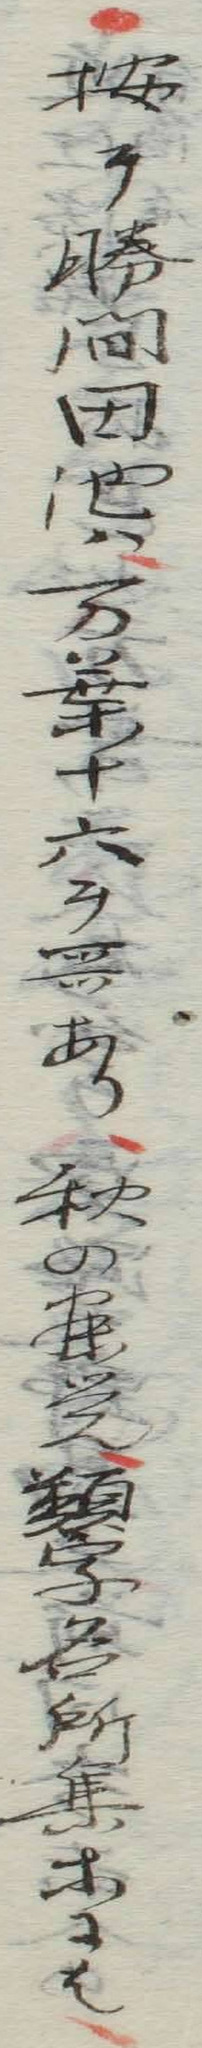●按に勝間田池は、万葉十六に歌あり、秋の寝覚、類字名所集等には、

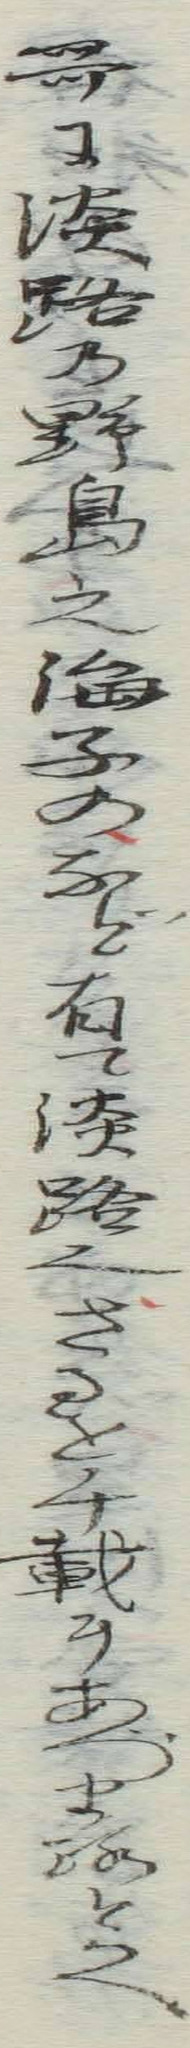歌に淡路の野島之海子の、など有て淡路也、さるを千載にあづま路とかへ
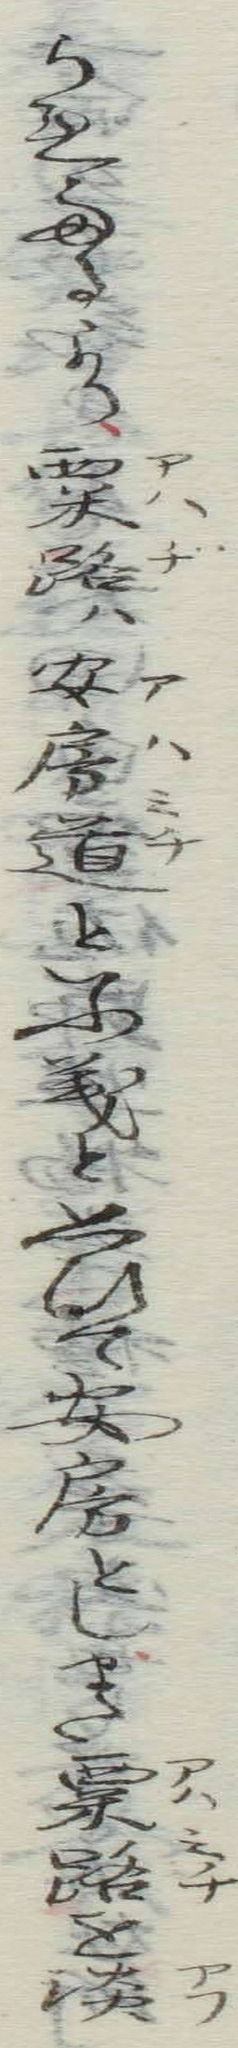られたるより、粟路は安房道といふ義と思ひて安房とし、また粟路を淡
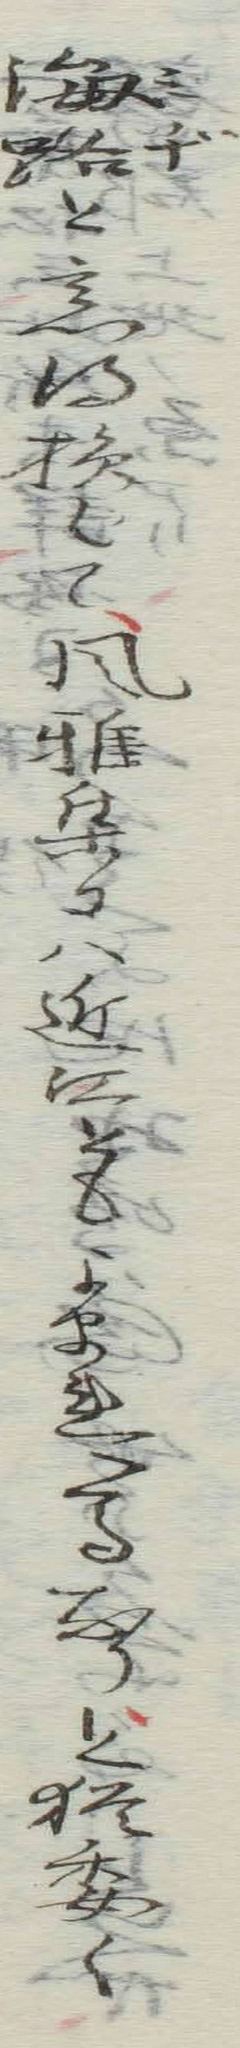海路と意得損して、風雅集には近江ともよまれたるなり、と猶委く
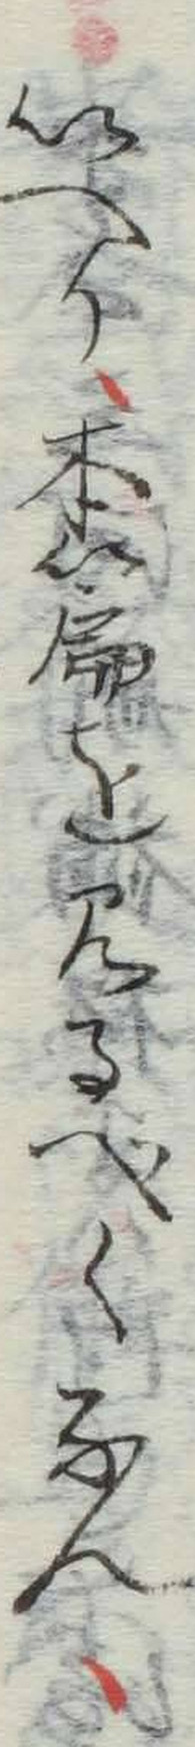いへり、本篇を見るべくなん、
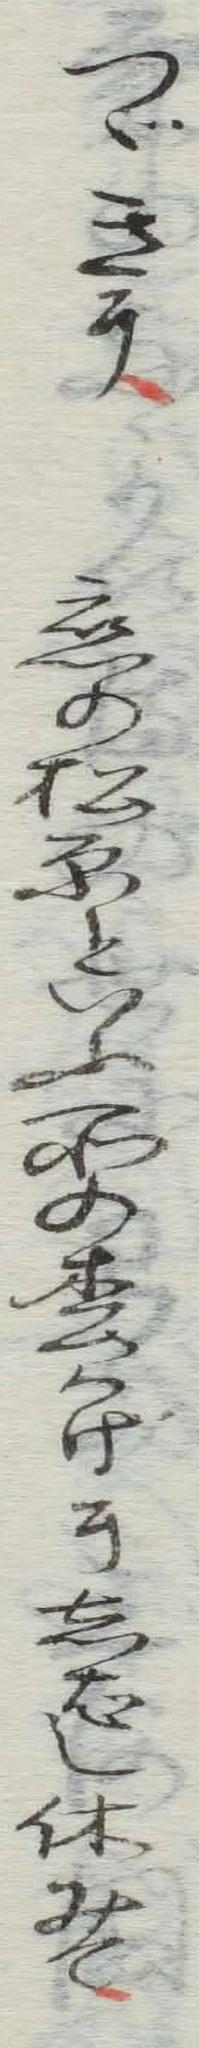つゞきに、恋の松原といふ所の松かげにしばし休みて、
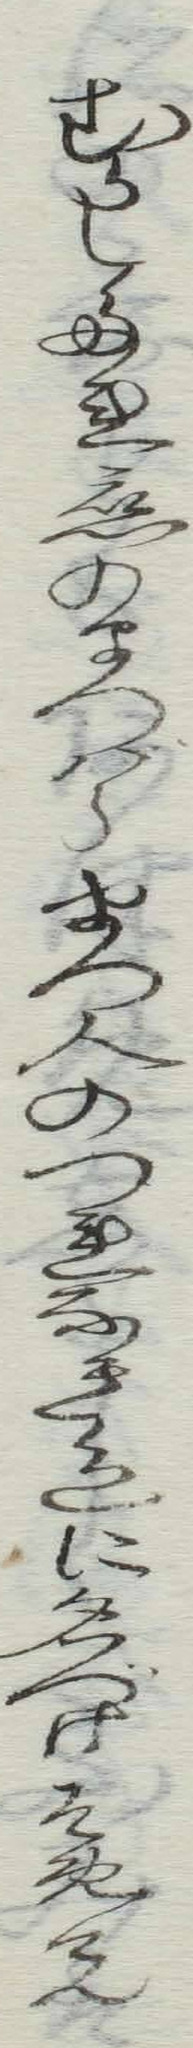むかしたれ恋のまつばらまつ人のつれなき色に名づけそめけん
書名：三河国古跡考
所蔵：国文学研究資料館
